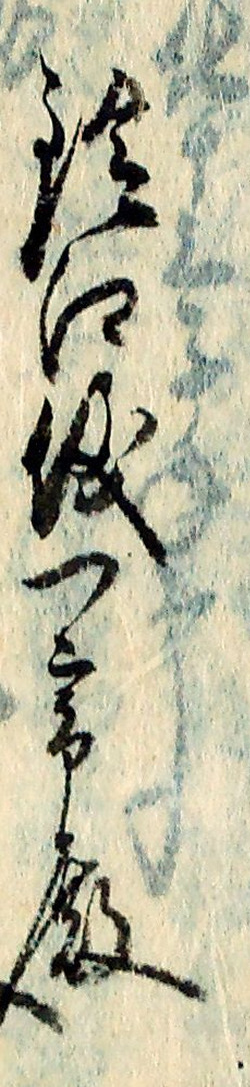鈴江儀一郎殿
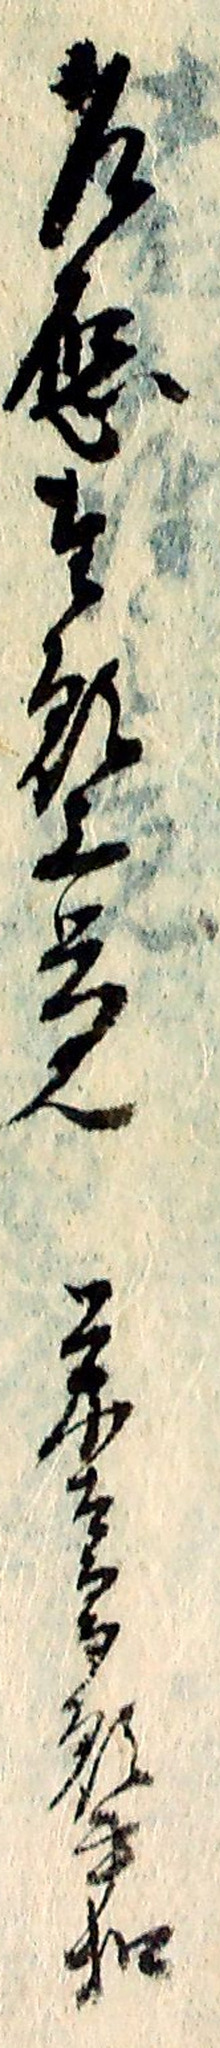乍恐奉願上覚栄太郎願書扣
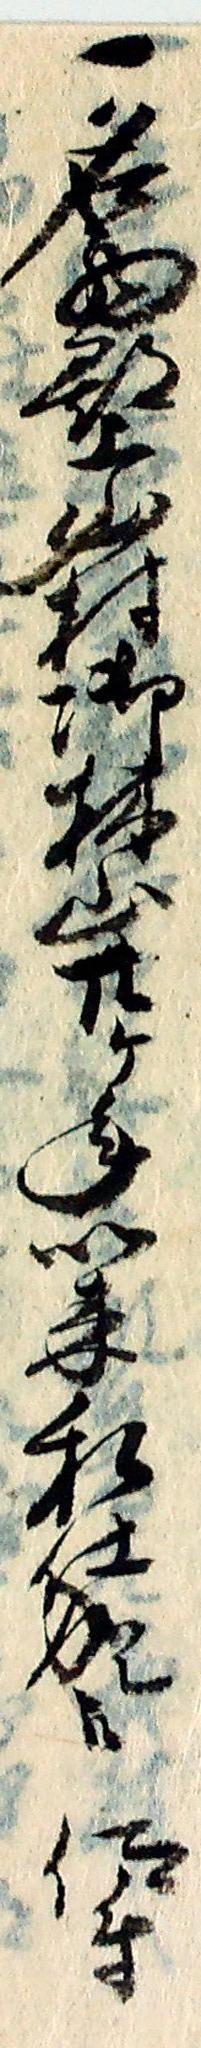一名西郡上山村御林山廿ヶ年以来私仕成し被仰付
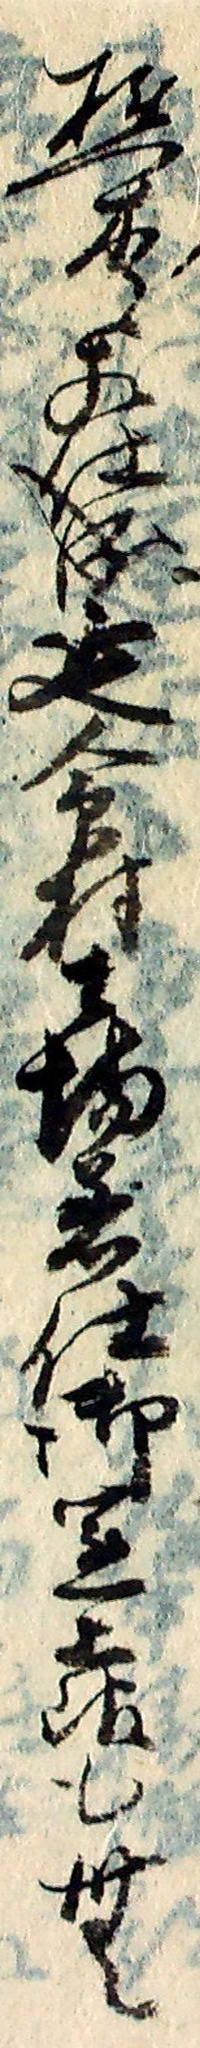樵木に相仕成延命村土場着仕御運上銀も無
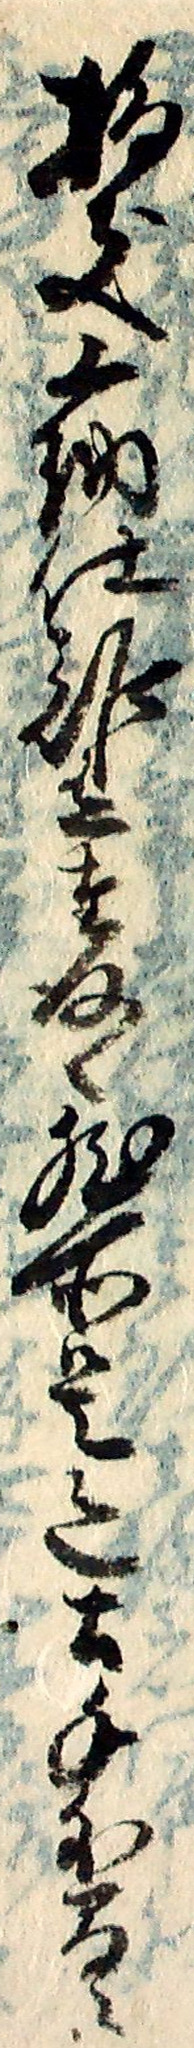指支上納仕難有奉存候然所是迄土手外間に
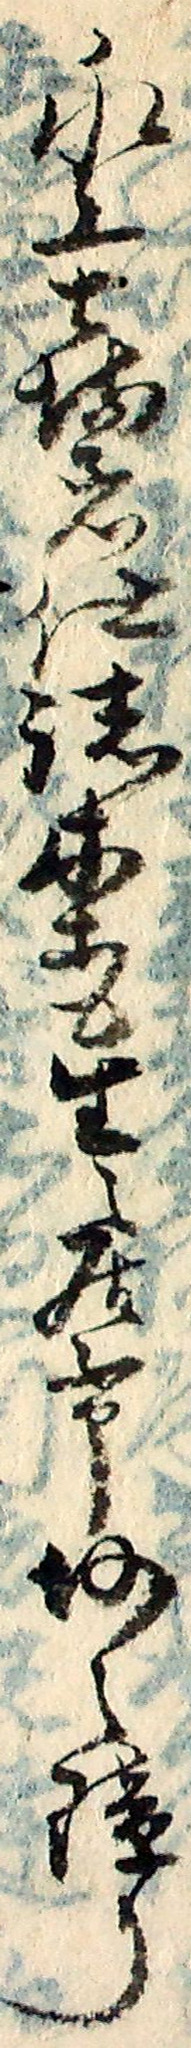水上土場着仕諸木等も生し居不申何之障り
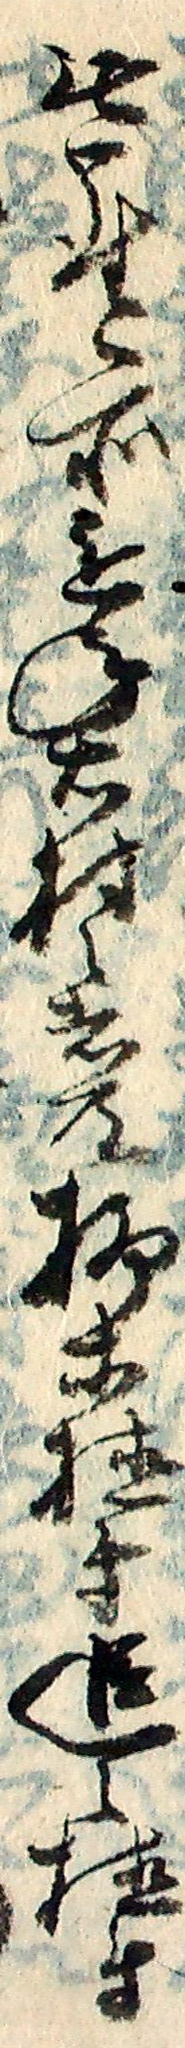無御座候所近年右村之者共柳木植付追々植付
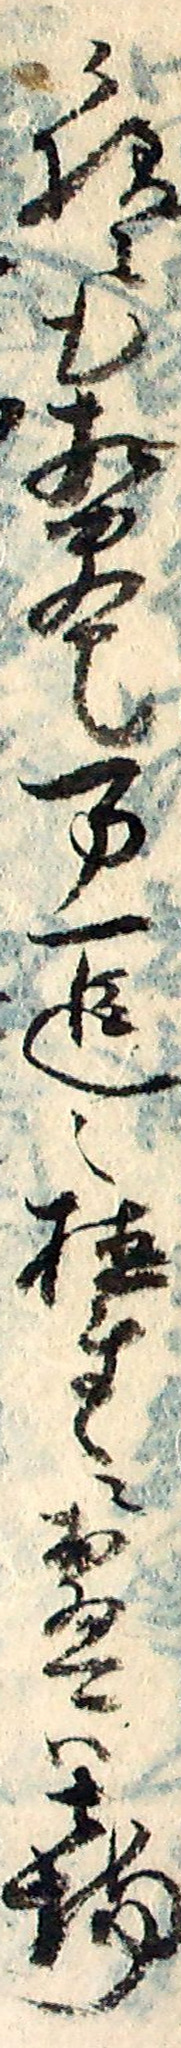候様にも相聞申候万一追々植付候におゐては土場
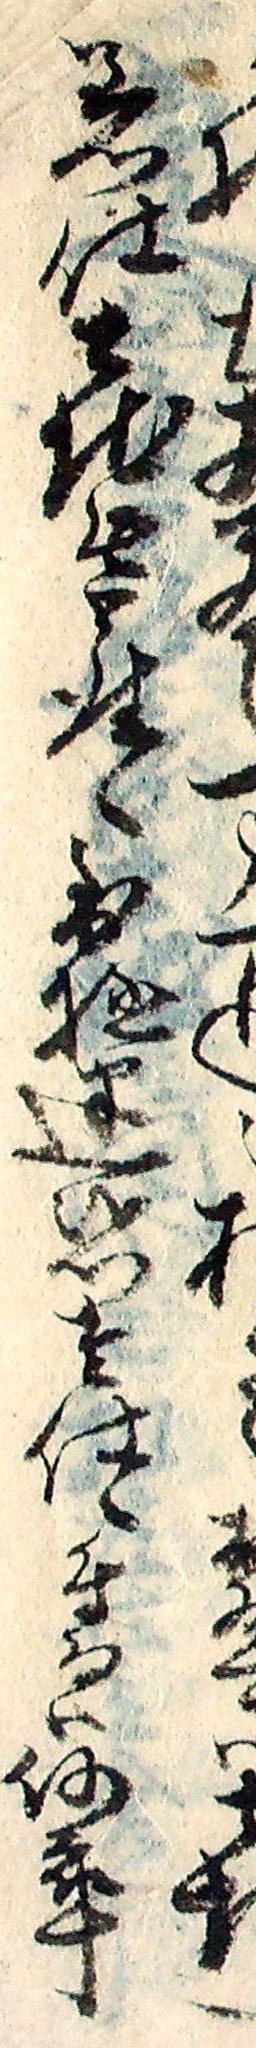着仕土地無御座候至極迷惑奉仕候付ては何卒

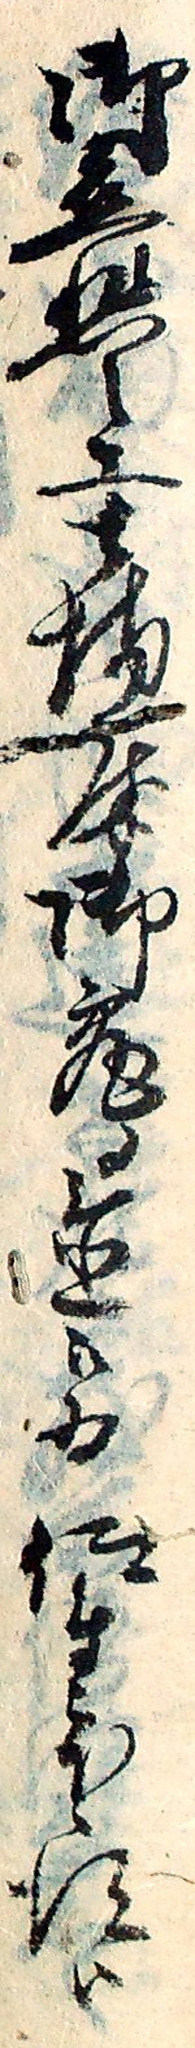御慈悲之上土場床御究め置被為仰付被下候得は
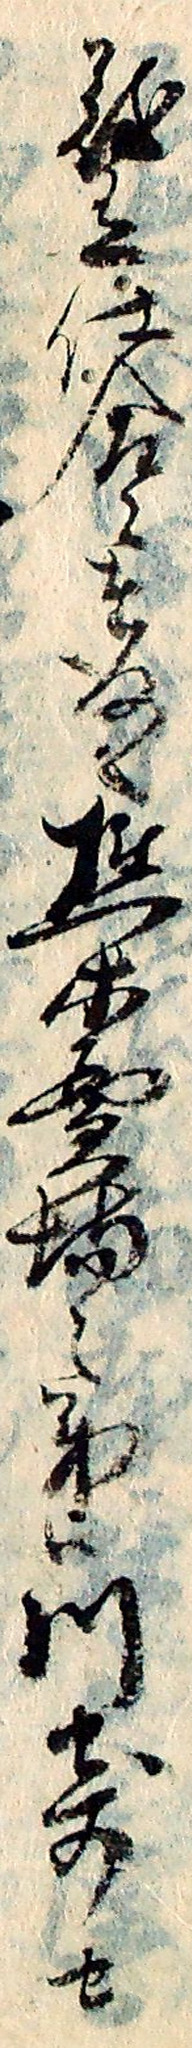難有仕合に奉存候樵木売場之義は川寄せ
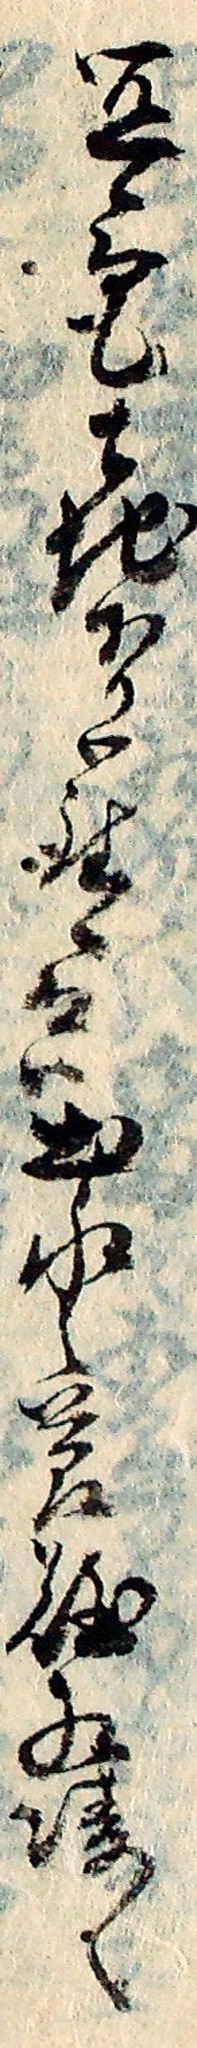宜候ても土地下り御座候ては出水之節難相凌候
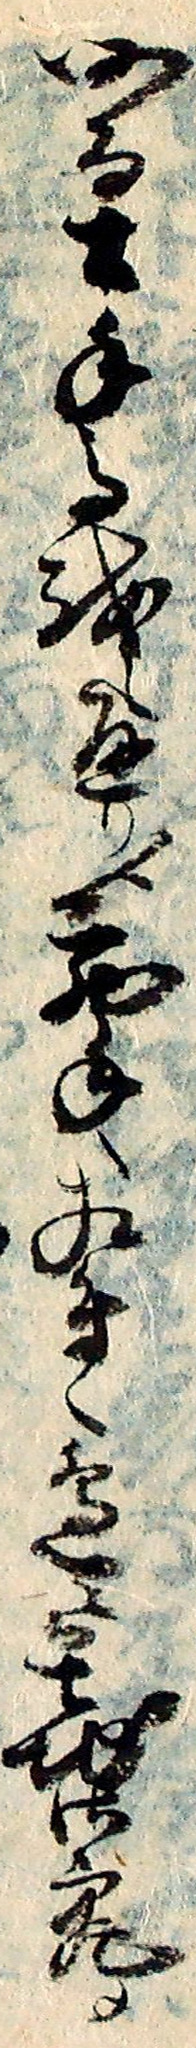仍て土手高越候通りゟ西手へ相付候辺にて土地御究め
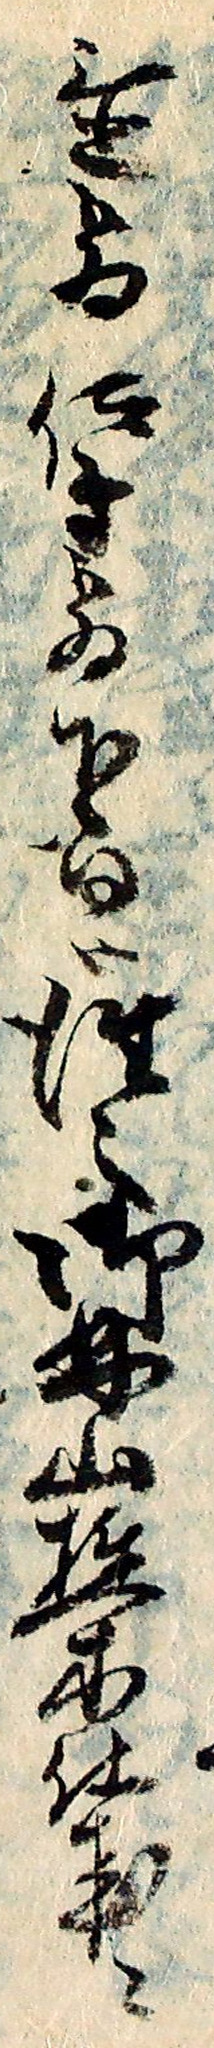置被為仰付被為下候得は往々御林山樵木仕来に
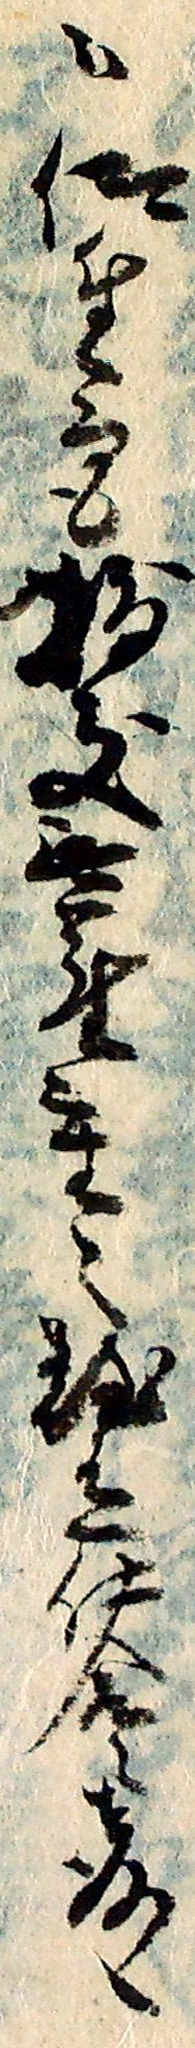被仰付候ても指支無御座重々難有仕合に奉存候
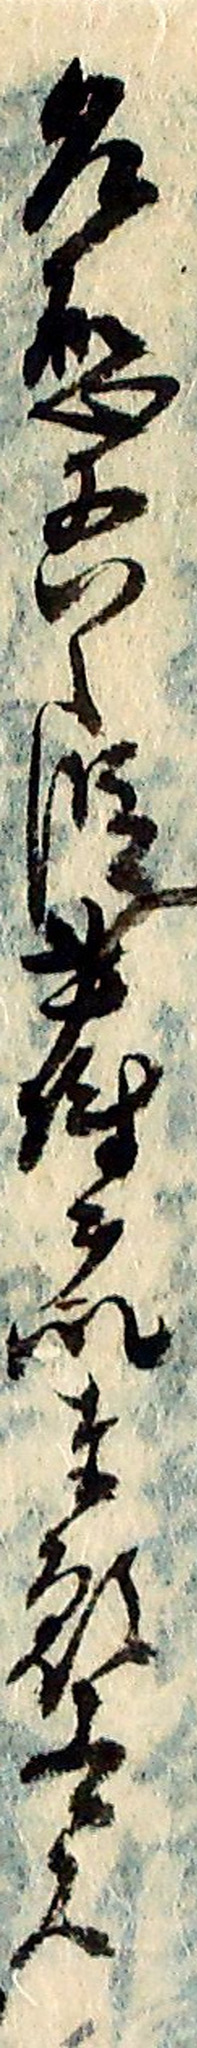乍恐右之段書付を以奉願上候以上
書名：諸御願書控(後藤氏壱番）
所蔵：鳴門教育大学 Naruto University of Education
